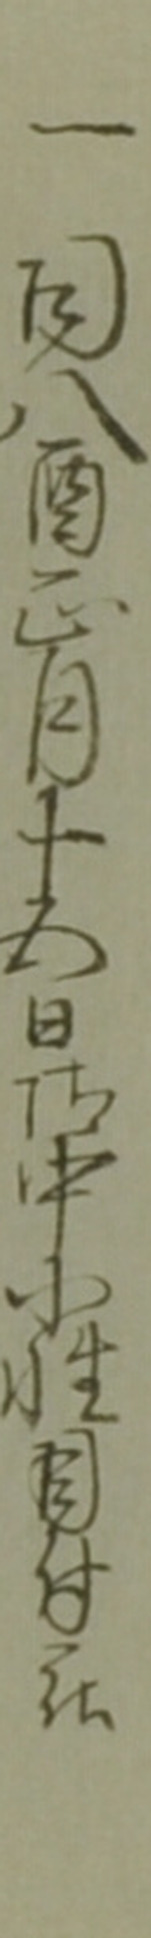一同八酉正月十五日御中小性目付被
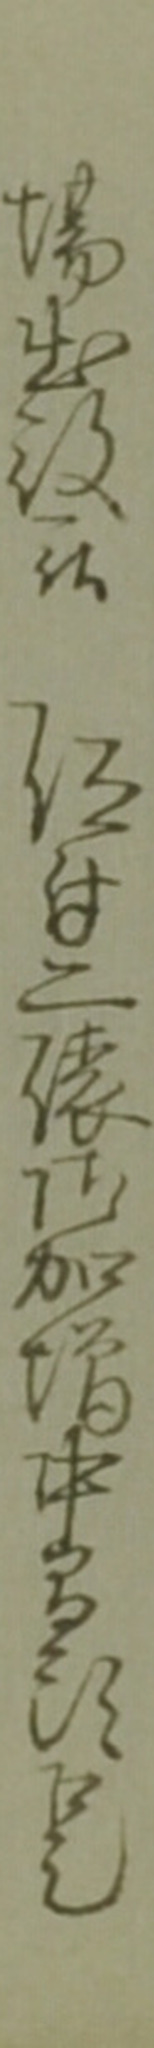場出役被仰付二俵御加増中間頭是
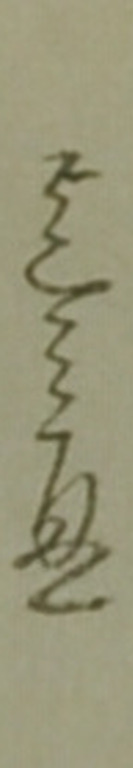迄之通
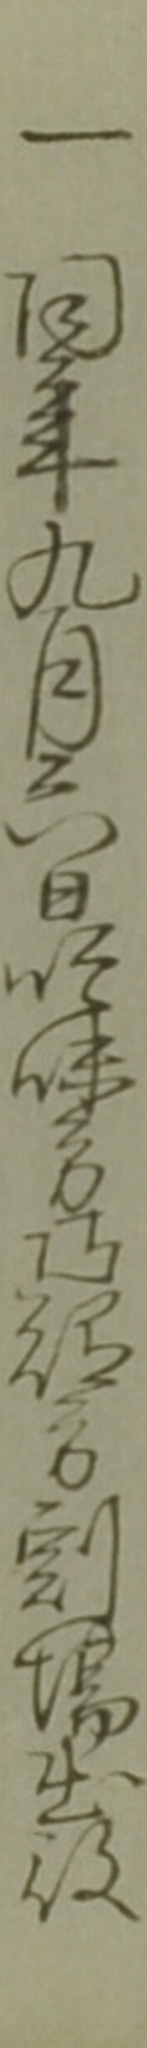一同年九月六日吟味方御賄方割場出役
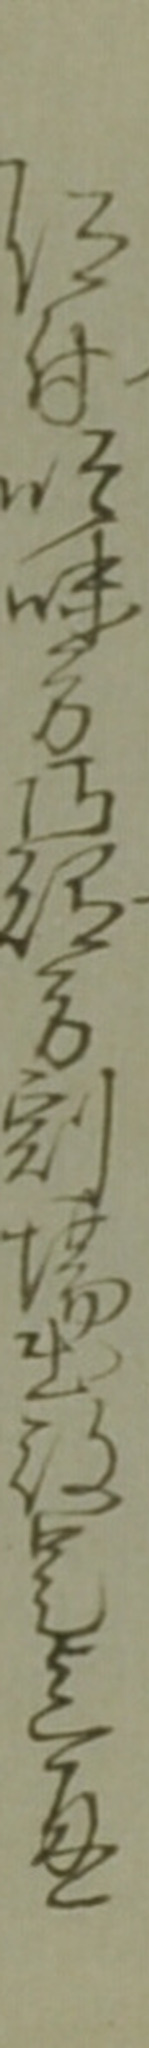仰付吟味方御賄方割場出役是迄之通
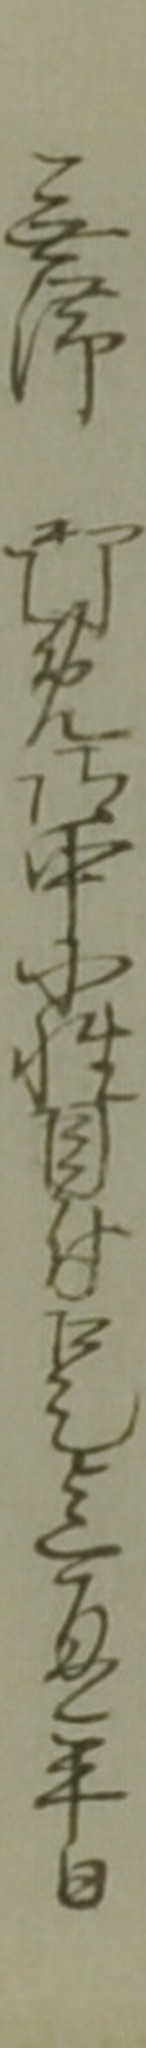無滞御免御中小性目付是迄之通平日
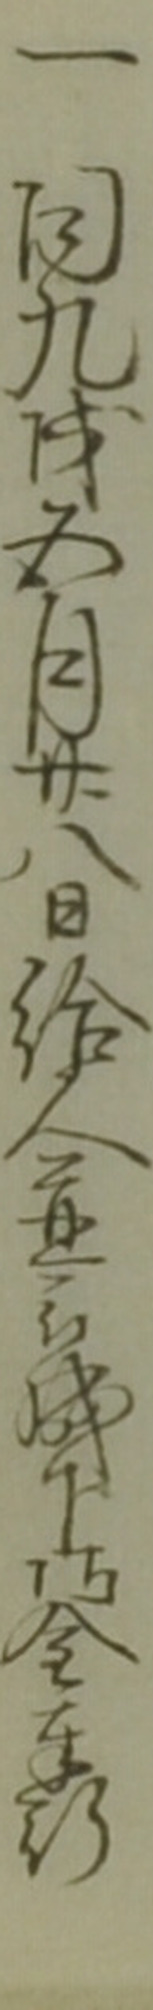一同九戌五月廿八日給人並被成下御金奉行
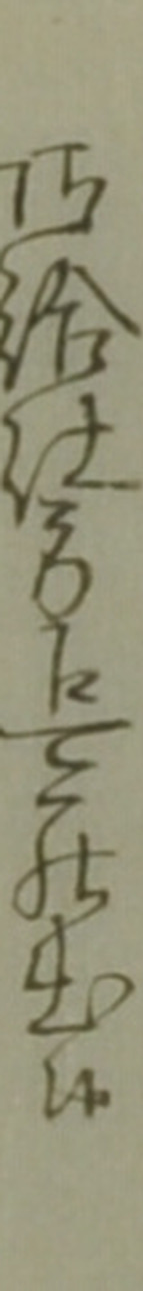御給仕方江罷出候
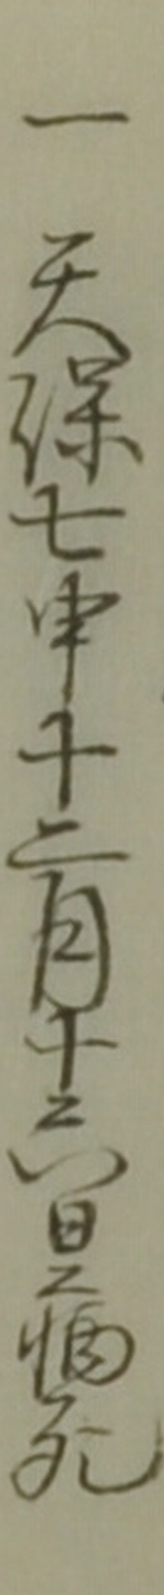一天保七申十二月十六日病死
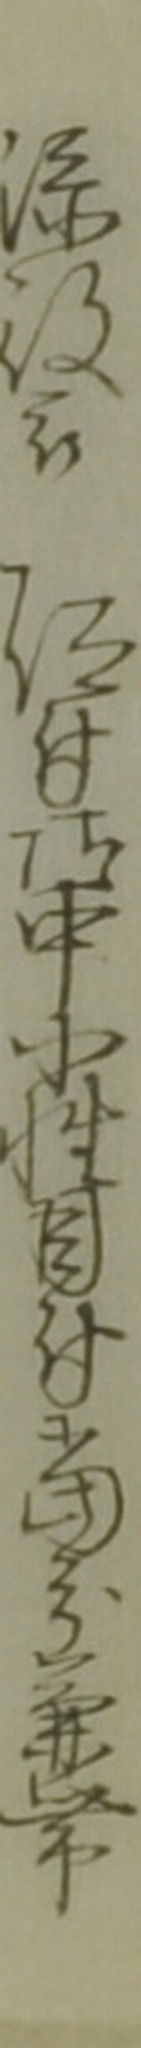添役被仰付御中小性目付当分兼帯
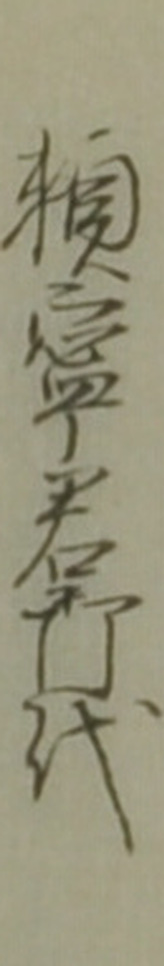頼寧君御代
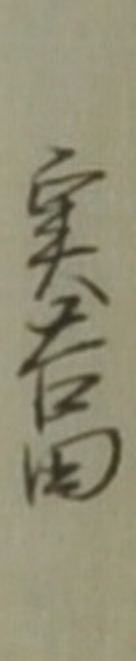実吉田
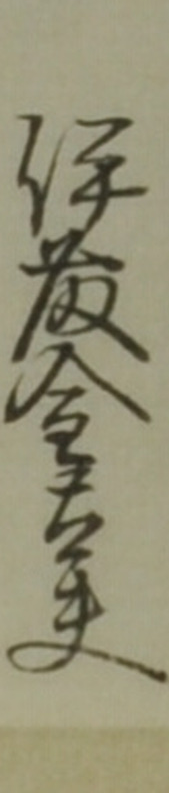伊藤金太夫
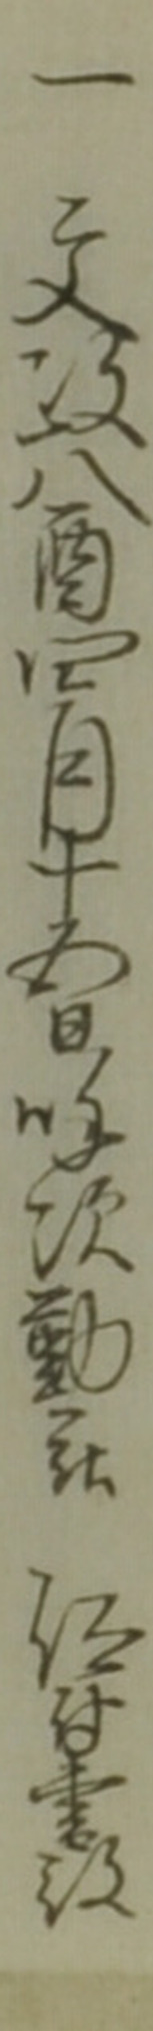一文政八酉四月十五日呼次勤被仰付書役
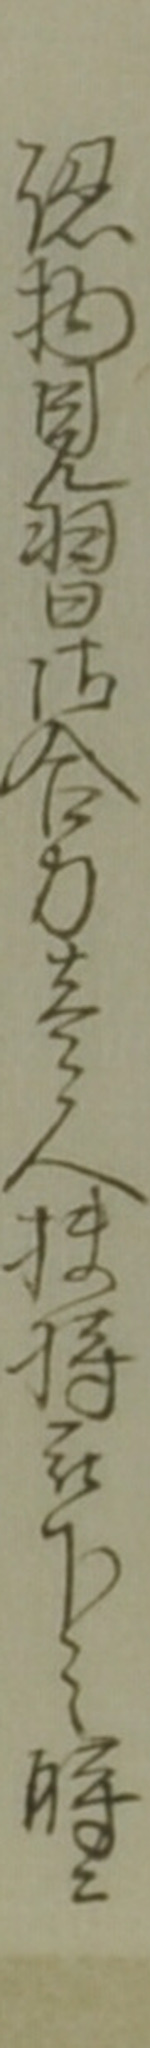認物見習御合力壱人扶持被下之時ニ
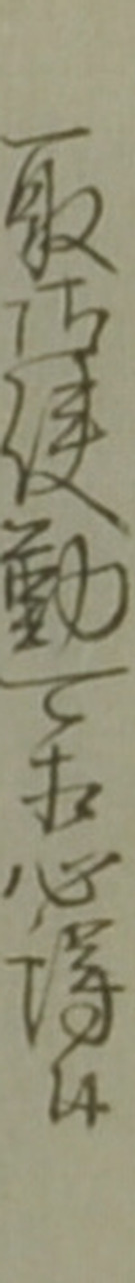取御使勤可相心得候
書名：無足諸士勤仕録（一）
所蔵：伊那市立高遠町図書館・合同会社AMANE
